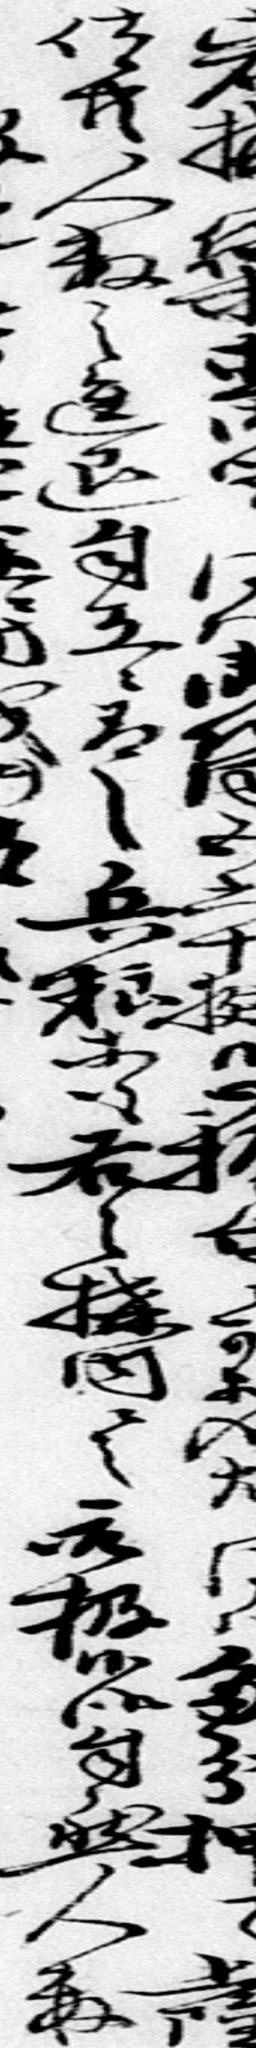仕候共人数之進退自在に有之兵粮等も右之構内にて取扱候様自然人数
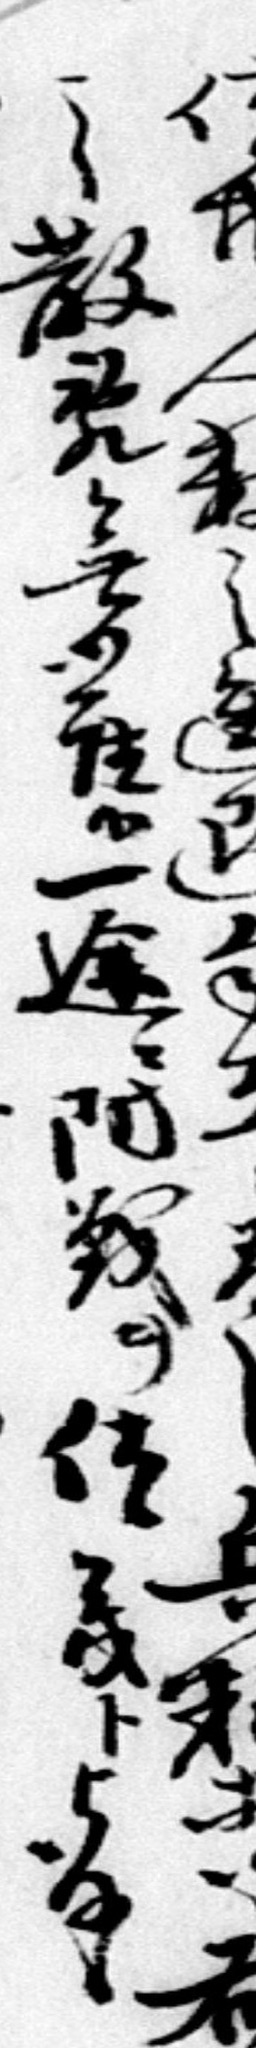之散乱は無御座候一途に防戦を仕候義と被存候
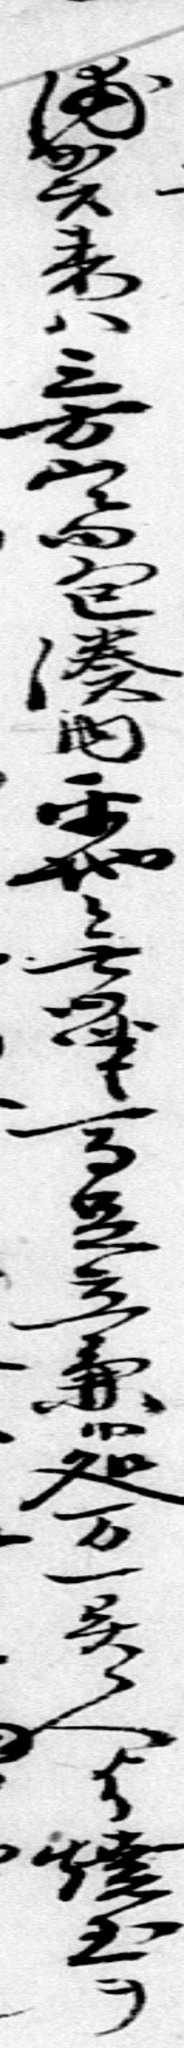一浦賀表は三方山に而包湊内平地は無御座候馬足立兼候処万一異人より焼玉を
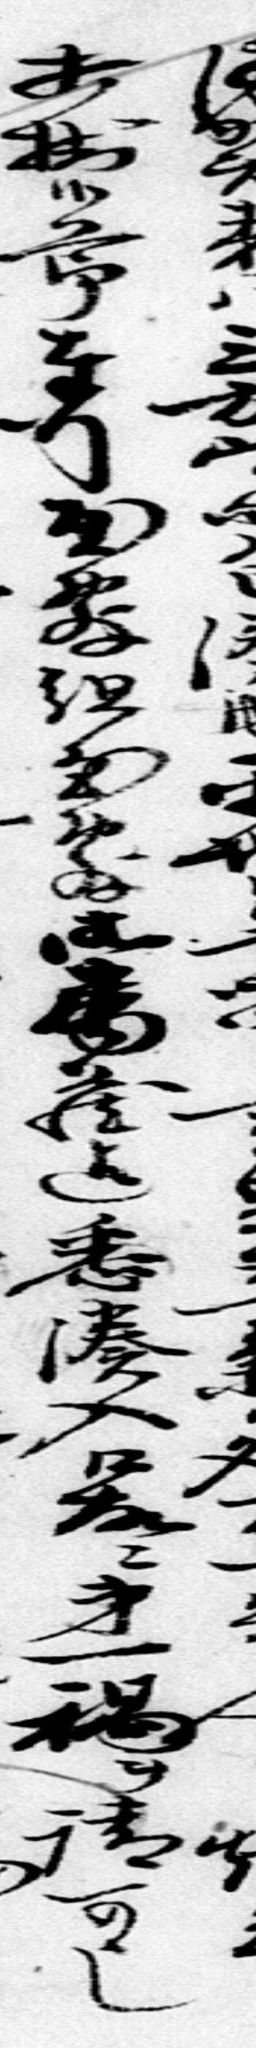打掛候節奉行屋敷組屋敷御番蔵迄悉湊入口故に第一禍を請可申候
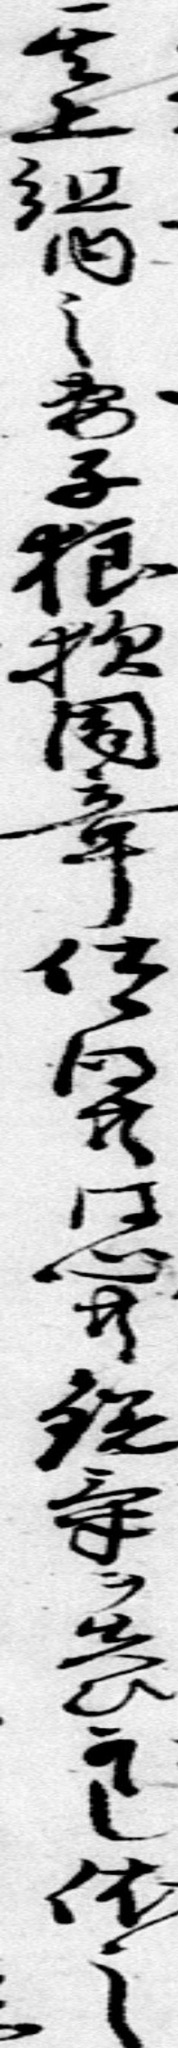其上組内之妻子狼狽周章仕候得共同心共鋭気を失ひ可申候依之
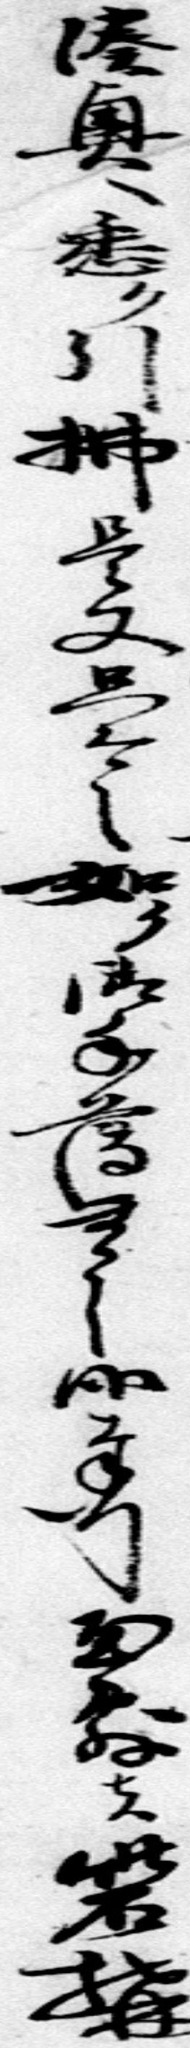湊奥へ悉く引払是又只今之如く御手薄無之様奉行屋敷は砦構

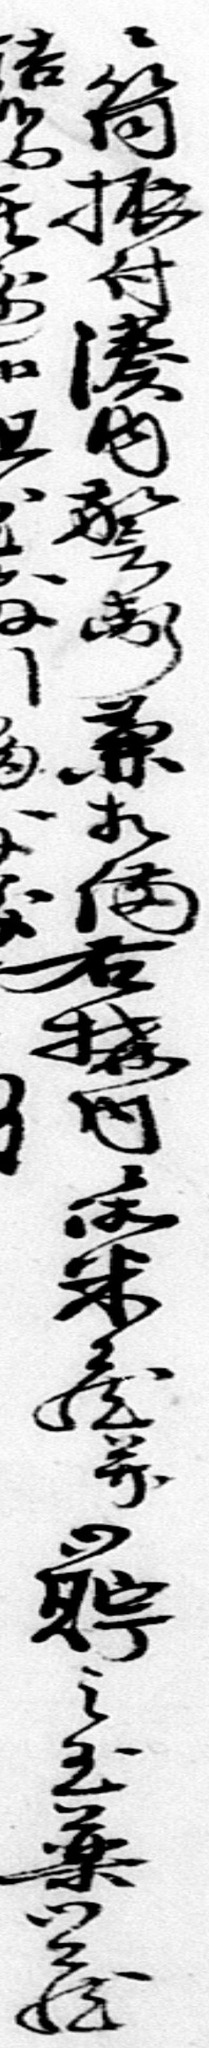に筒振付湊内警衛兼相備右構内に御米蔵幷御貯之玉御蔵
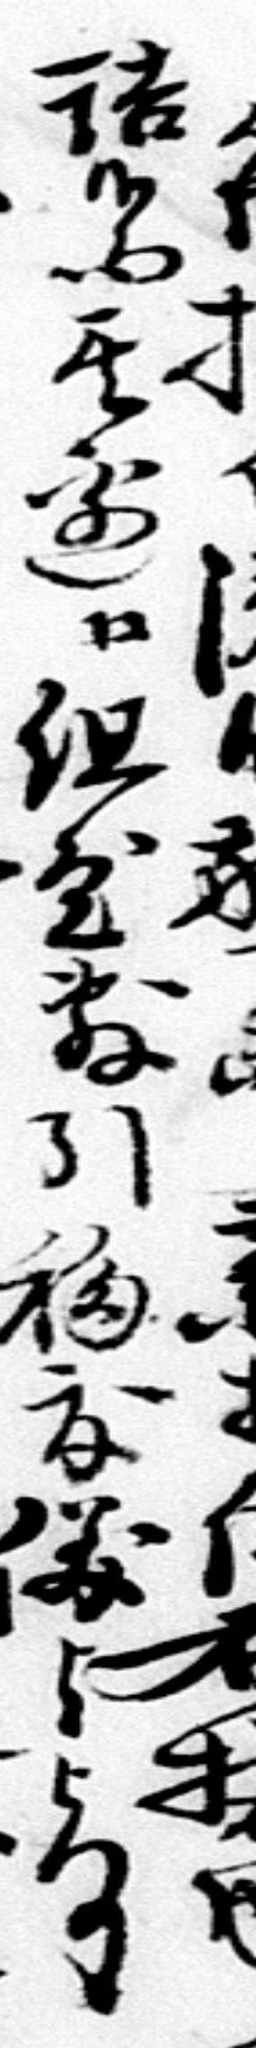詰候而其辺江組屋敷引移度義と被存候
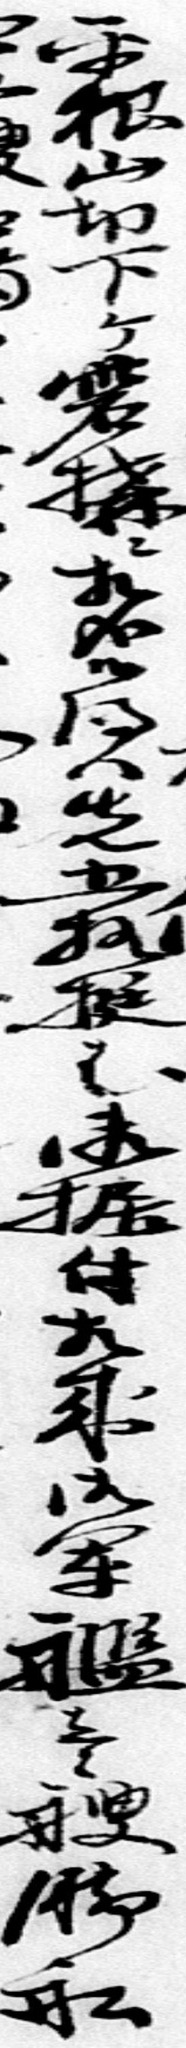一平根山切下け砦構に相成候得は先五拾挺は御据付相成御軍艦壱艘脚船
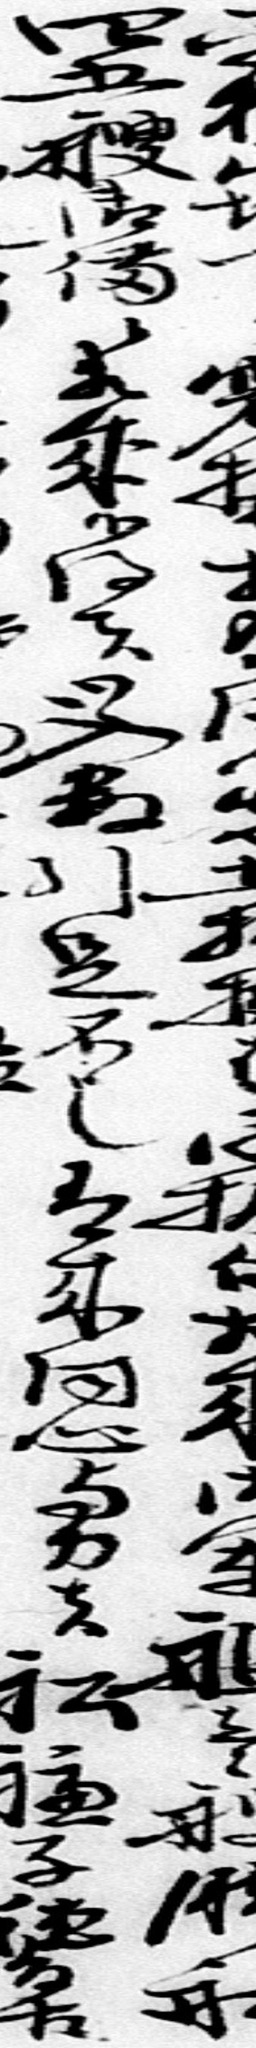四五艘御備に相成候得者御人数引足不申候有来同心与力は船艫子稽古
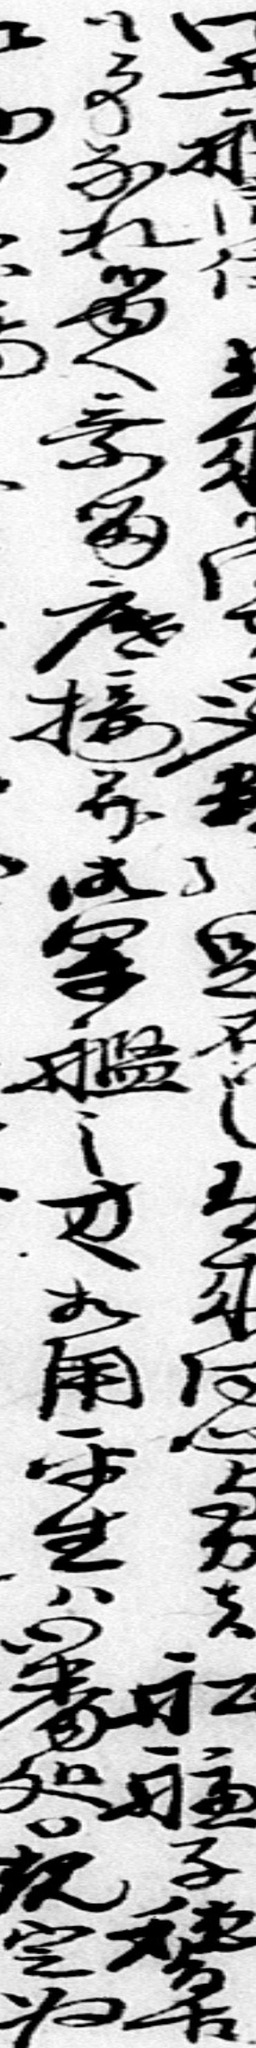も事なれ候ゆへ乗留底接幷御軍艦の方へ相用平生は御番処御規定為
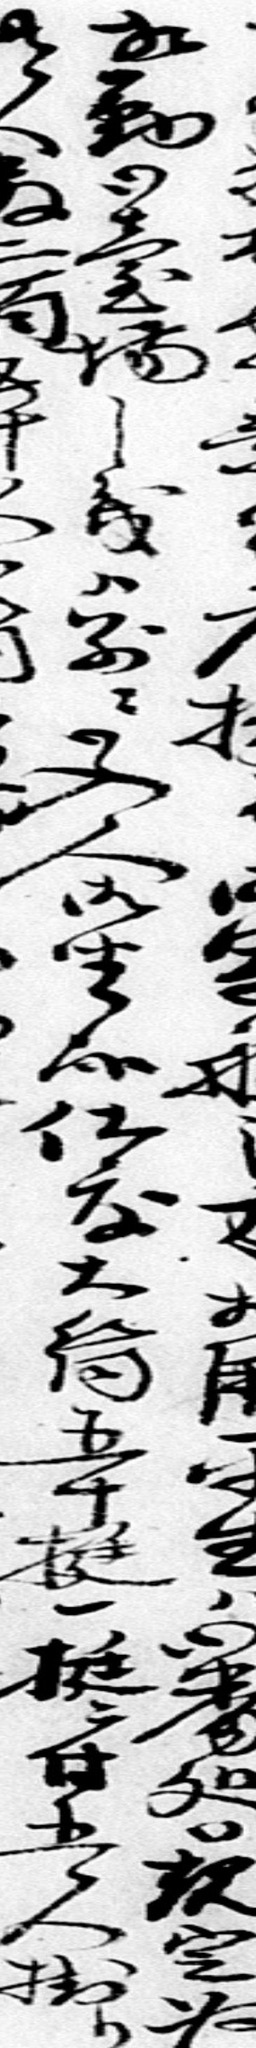相勤御台場之義は別に御入人御座候様仕度大筒五拾挺一挺に付五人掛り
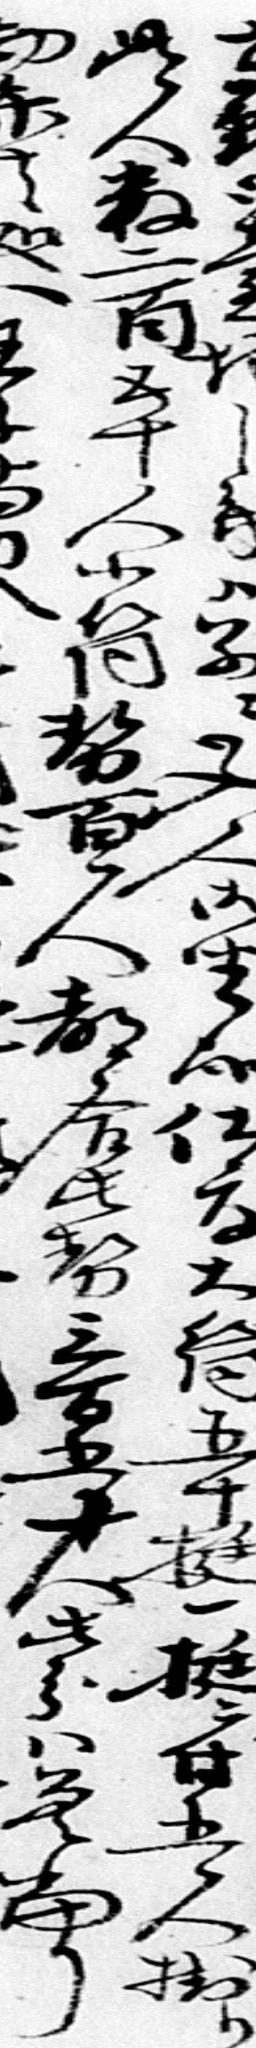此人数二百五十人小筒勢百人都合此勢三百五十人此分は差当り
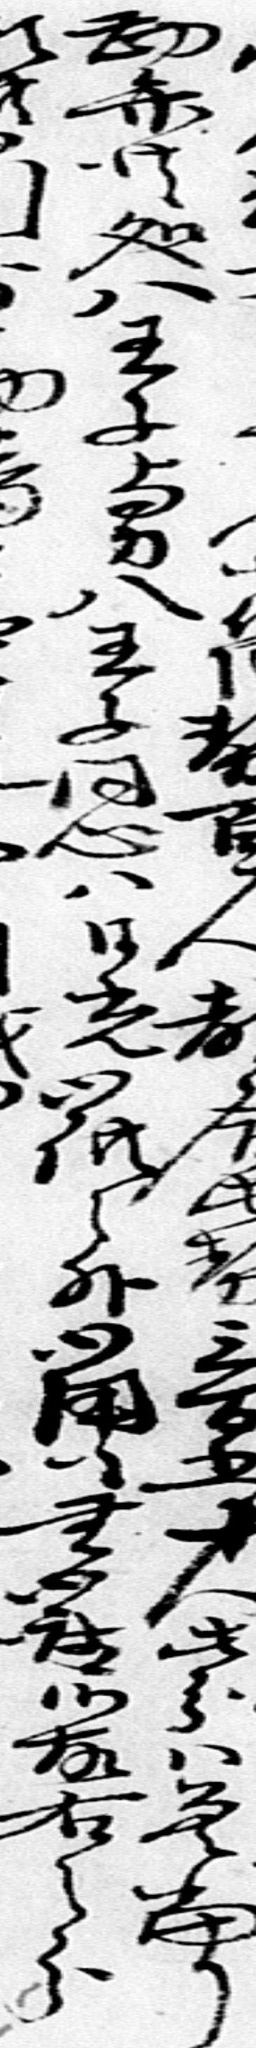勘弁仕候処八王子与力八王子同心は日光御供之外御用も無御座候故右之分
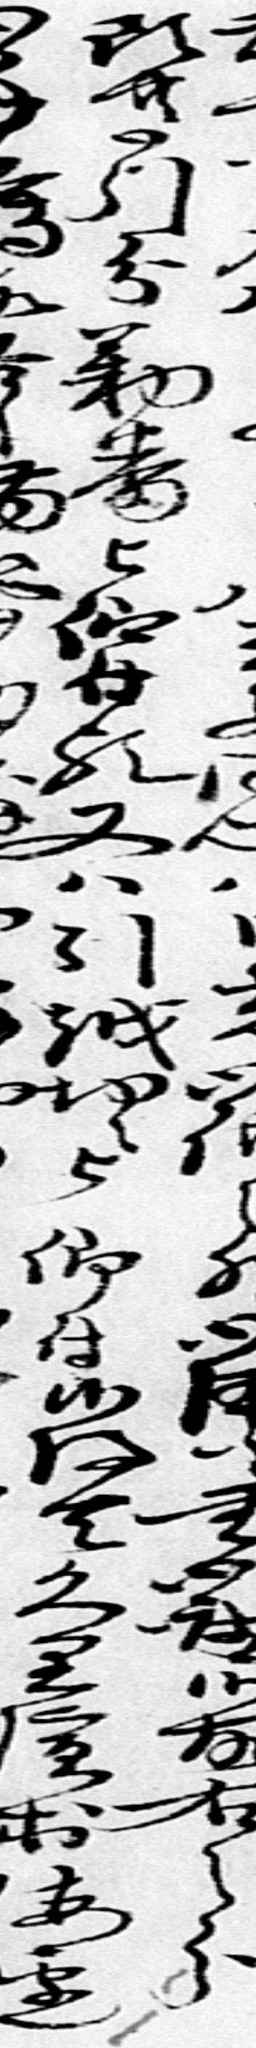頭共御引分勤番被仰付欤又は引越切に被仰付候得者久里浜村海辺
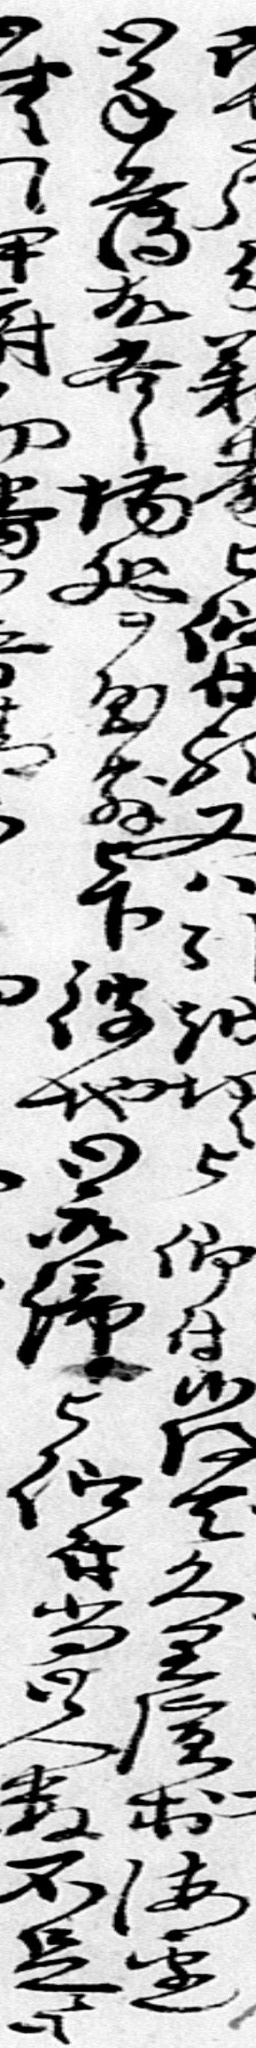御手薄故各之場処を屋敷被下彼地御取締被仰付尚御人数不足にも
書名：浦賀御奉行見込秘書写
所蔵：徳島県立図書館
